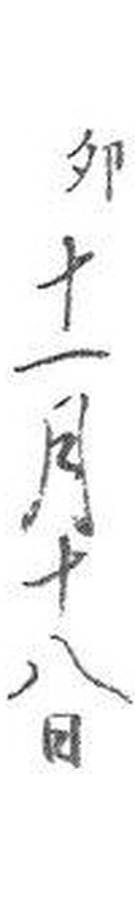卯十一月十八日
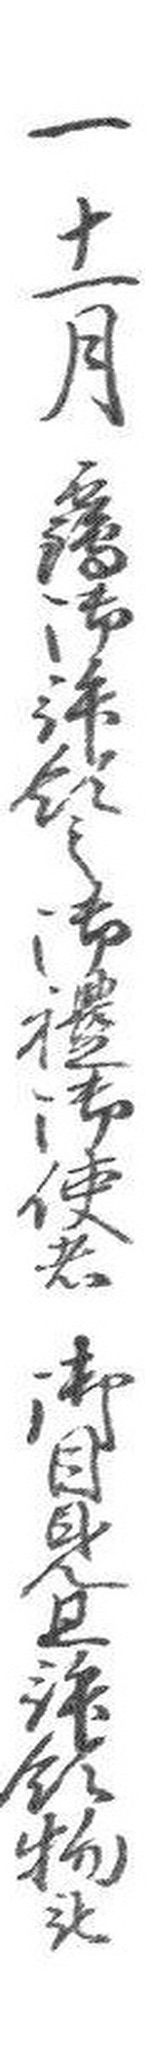一十一月鶴御拝領之御礼御使者御目見且拝領物被
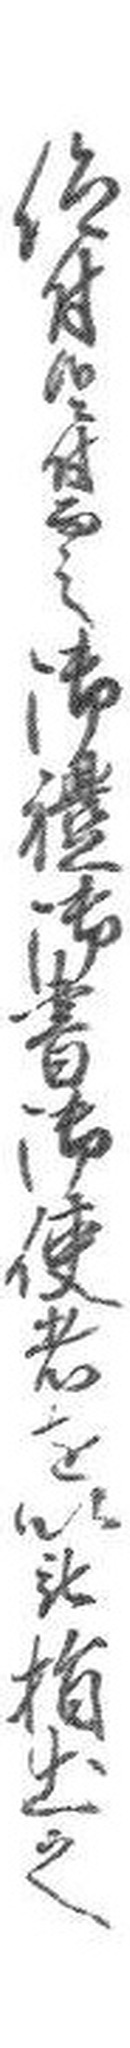仰付候ニ付而之御礼御書御使者を以被指出之
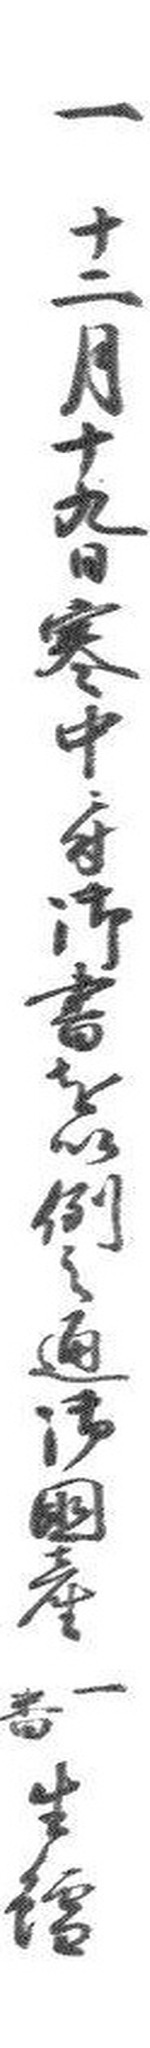一十二月十九日寒中ニ付御書を以例之通御国産一番生鱈
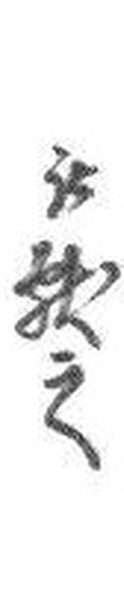被献之
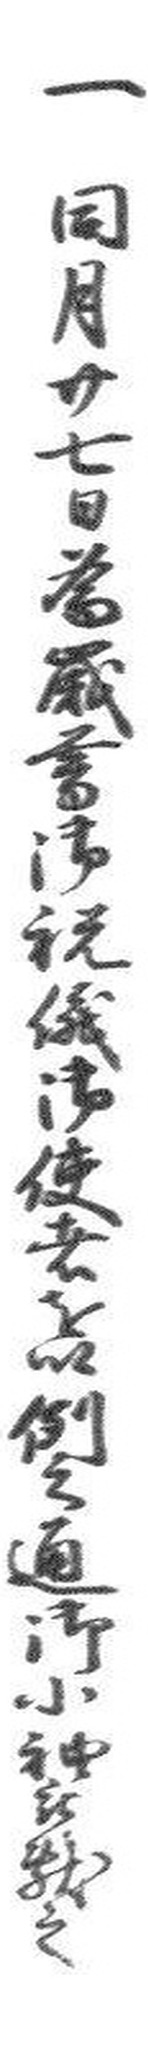一同月廿七日為歳暮御祝儀御使者を以例之通御小袖被献之
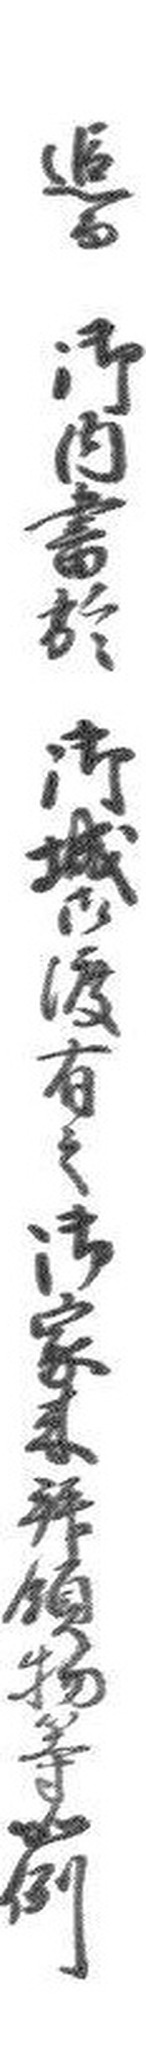追而御内書於御城御渡有之御家来拝領物等如例
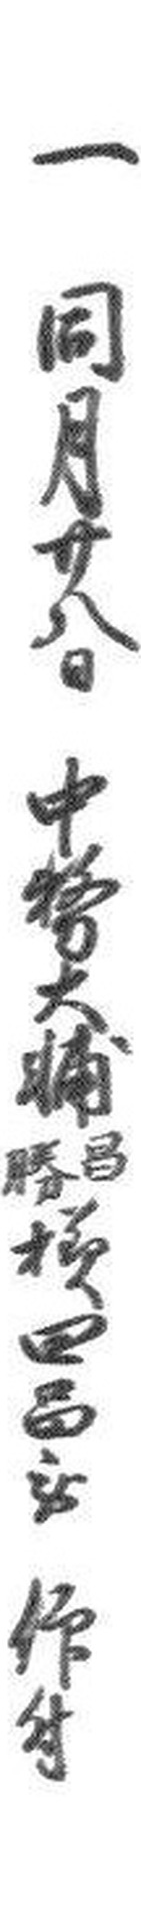一同月廿八日中務大輔昌勝様四品被仰付
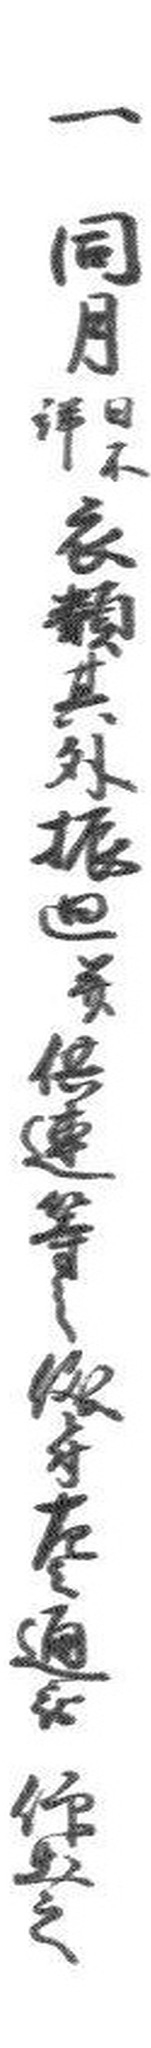一同月日不祥衣類其外振廻并供連等之儀ニ付左之通被仰出之
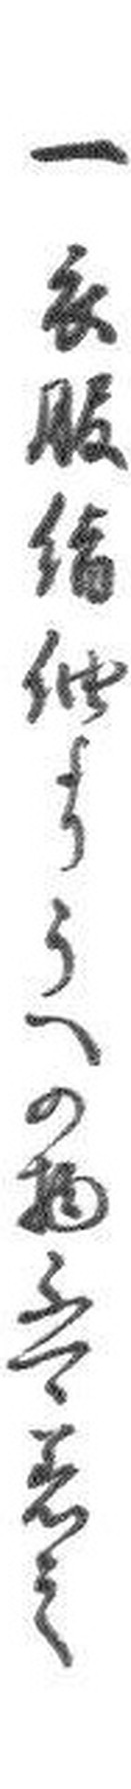一衣服絹紬よりうへの物不可着之
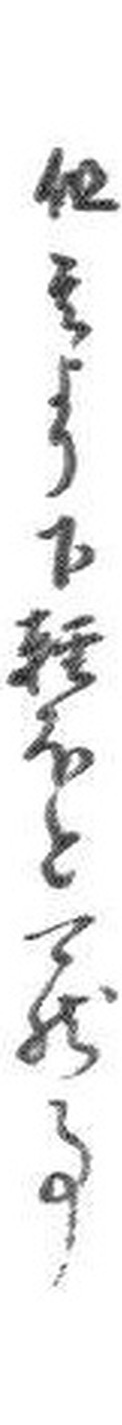但其より下軽ほと可然事
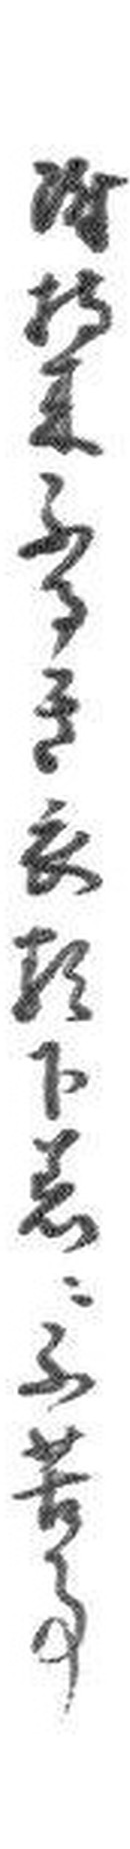附持来ふるき衣類下着ニ不苦事

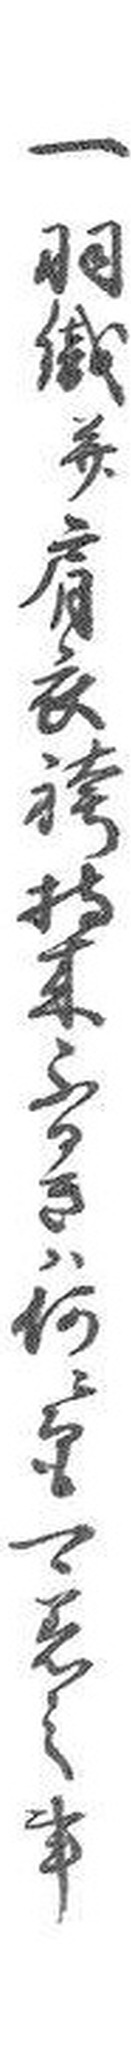一羽織并肩衣袴持来ふるきは何ニ而も可着之事
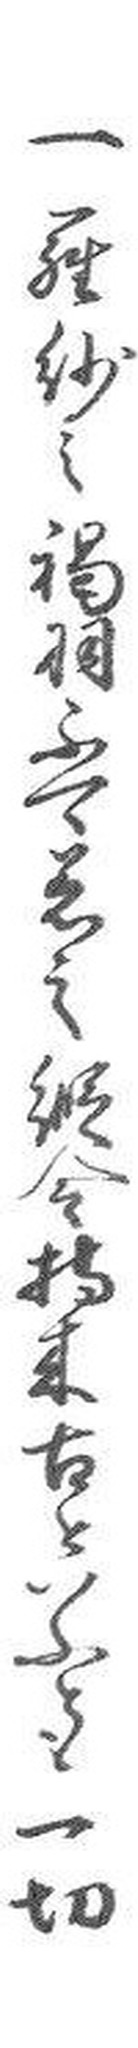一羅紗之褐羽不可着之縦令持来古といふとも一切
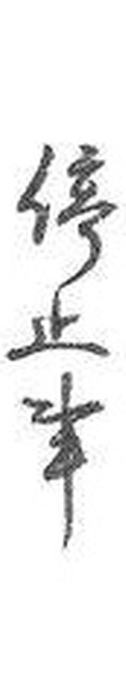停止事
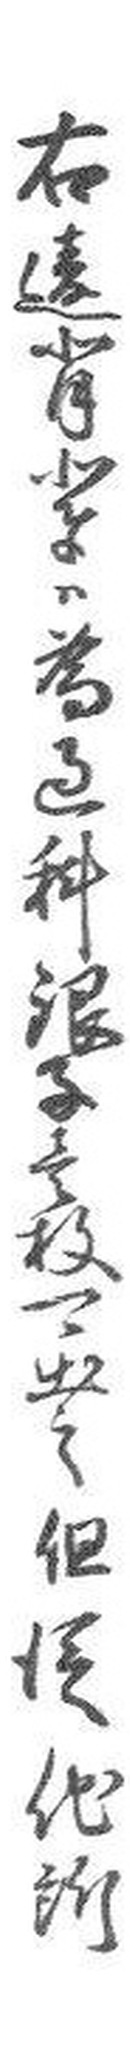右違背輩は為過科銀子壱枚可出之但従他所
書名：家譜 六 光通公 従万治三年到寛文三年
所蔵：福井県文書館 Fukui Prefectural Archives
